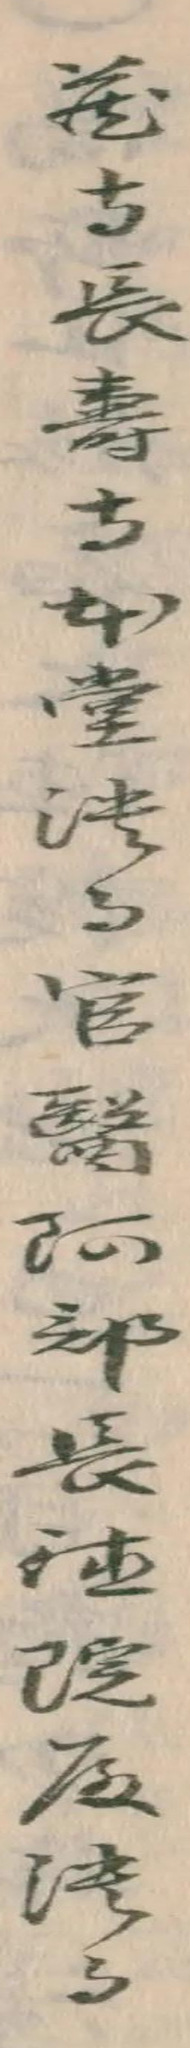蔵寺長寿寺本堂潰る官医阿部長徳院殿潰る
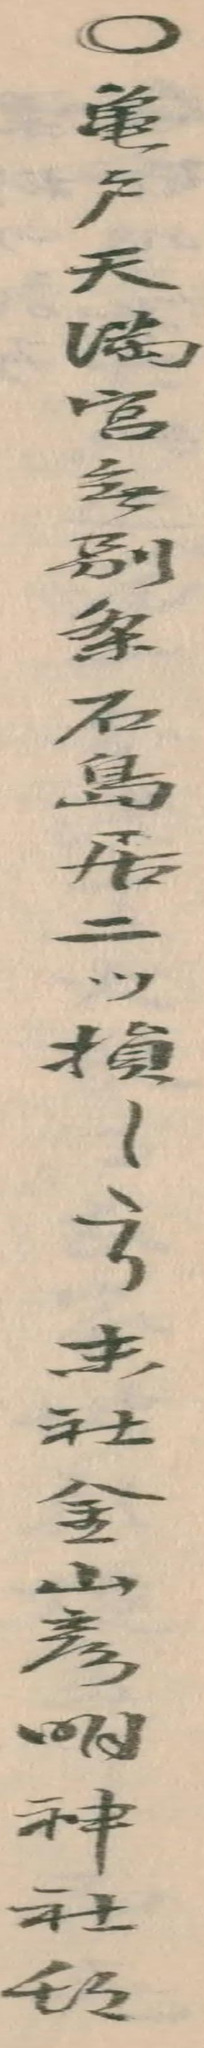〇亀戸天満宮無別条石鳥居二ッ損したり末社金山彦明神社頓
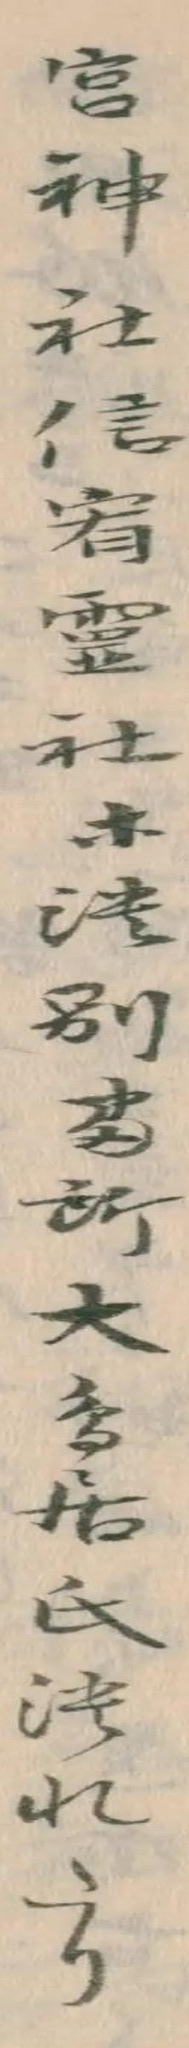宮神社信宥霊社等潰別当所大鳥居氏潰れたり
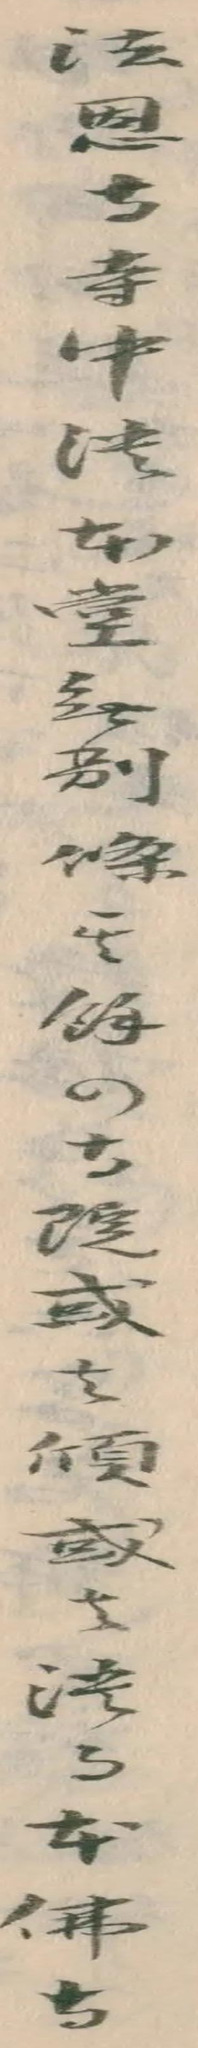法恩寺寺中潰本堂無別條其余の寺院或は傾或は潰る本仏寺
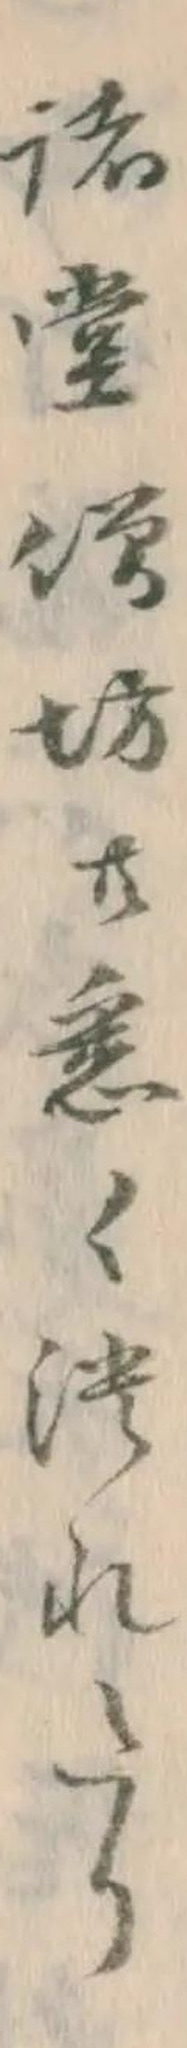諸堂僧坊共悉く潰れたり
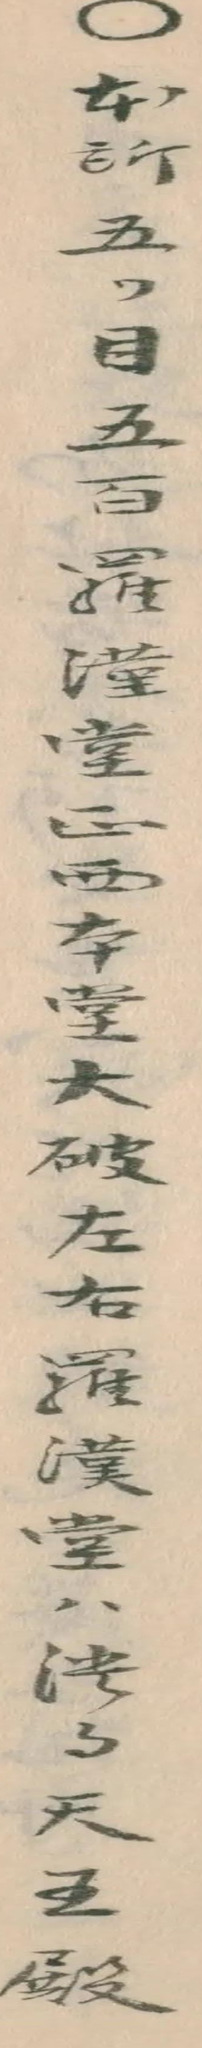〇本所五ッ目五百羅漢堂正西本堂大破左右羅漢堂は潰る天王殿

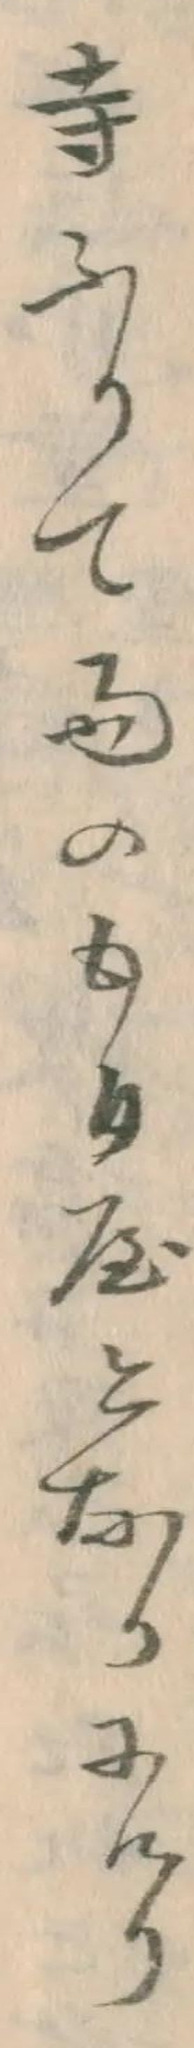寺ふりて雨のもり屋となりにけり
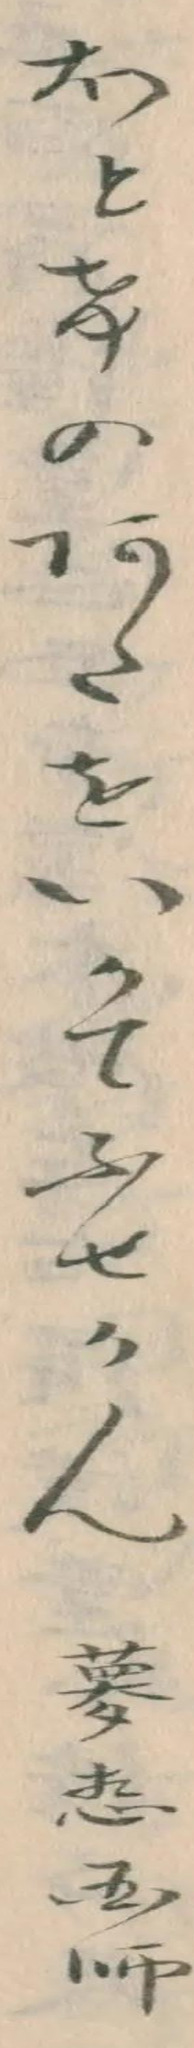ほとけのあたをいかてふせかん夢想国師
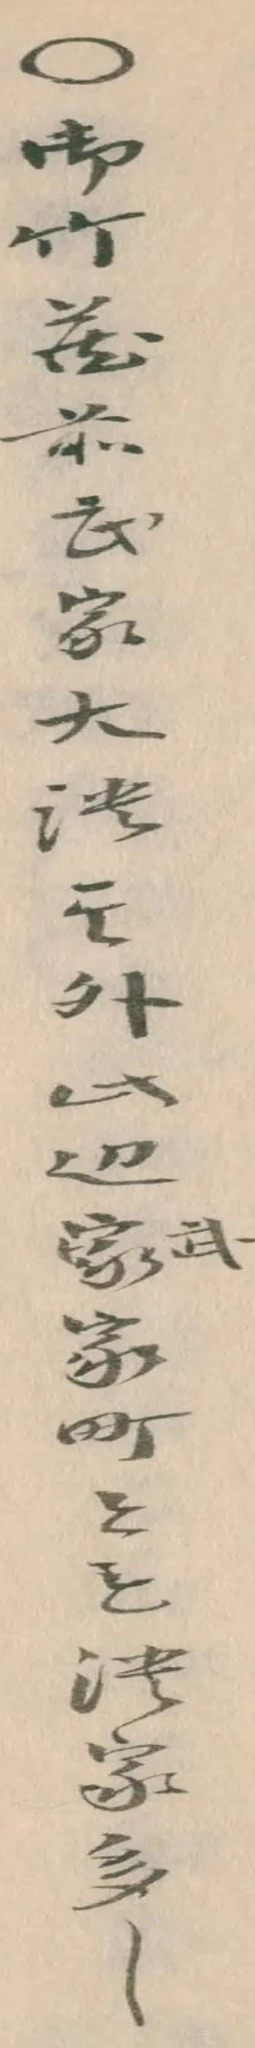〇御竹蔵前武家大潰其外此辺武家町とも潰れ家多し
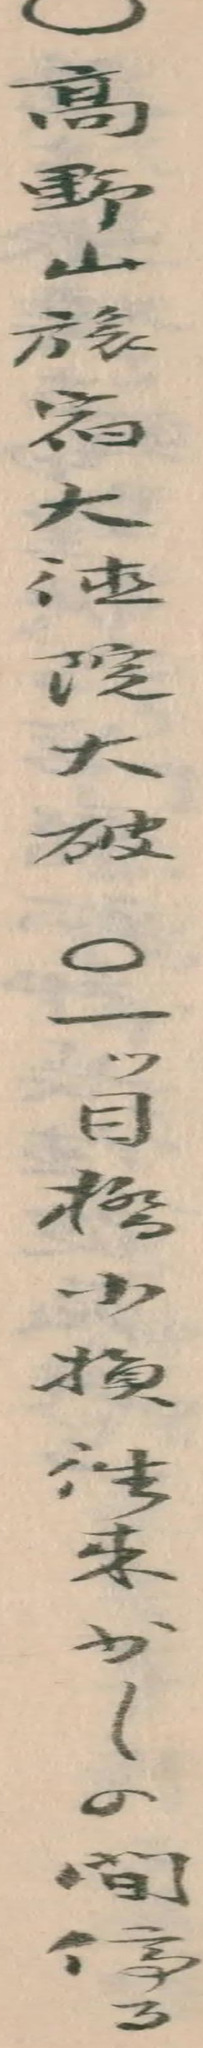〇高野山旅宿大徳院大破〇一ッ目橋小損往来少しの間停る
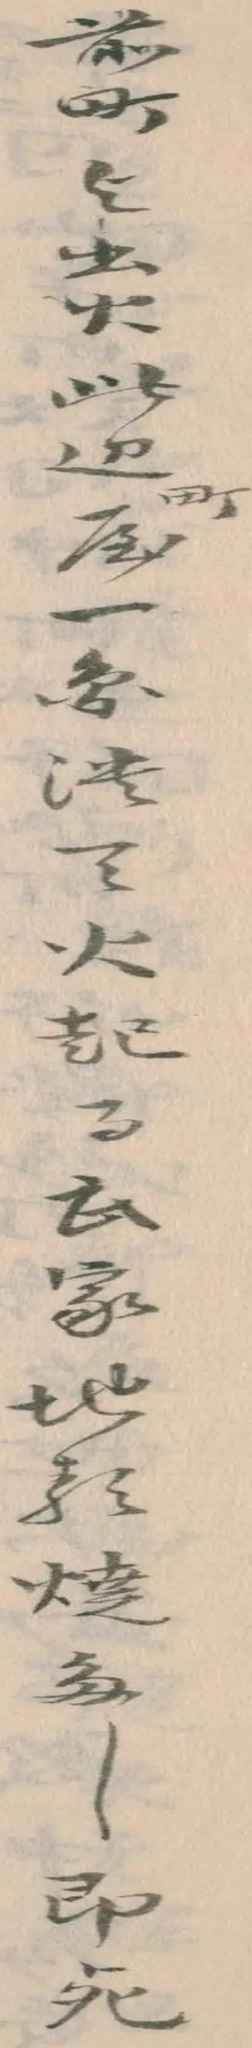前町よ出火此辺町屋一円潰て火起る武家地類焼多し即死
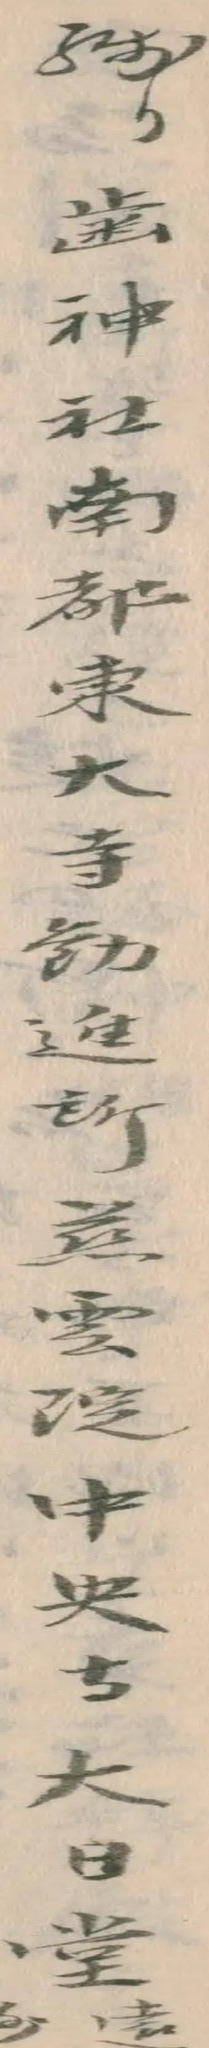残り歯神社南都東大寺勧進所慈雲院中央寺大日堂遠州
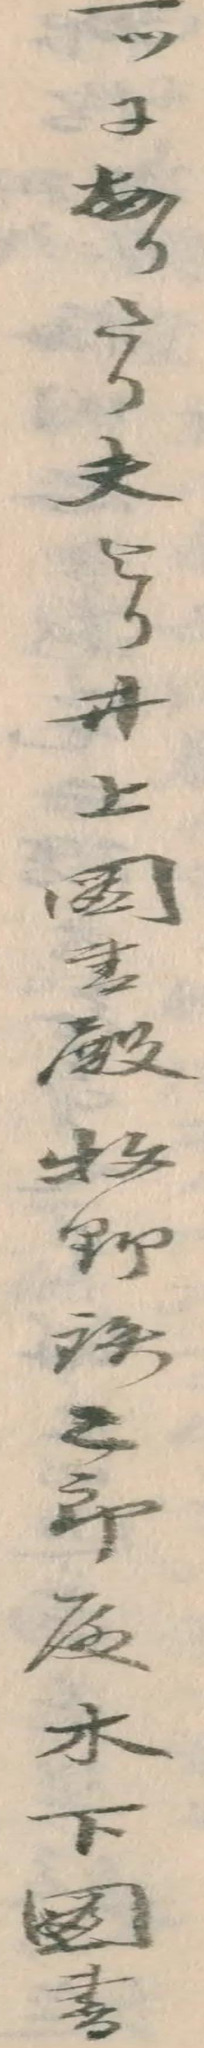一ッになりたり夫より井上図書殿牧野鉄二郎殿木下図書
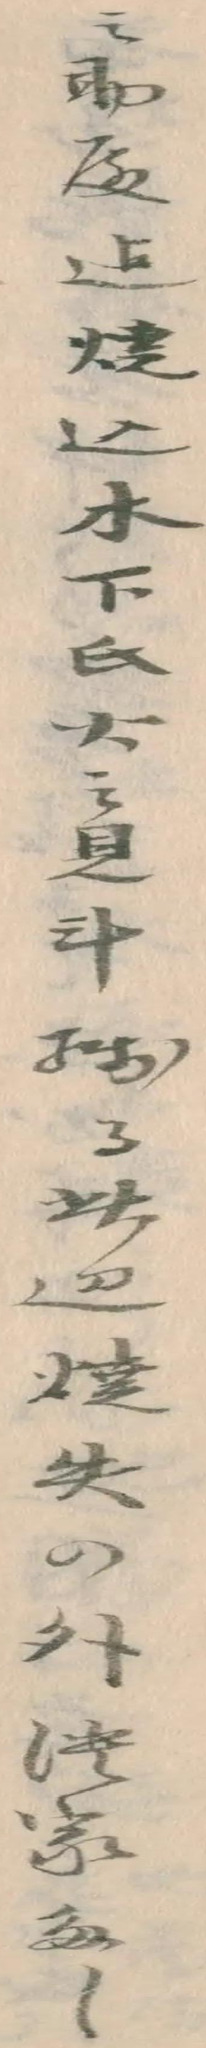之助殿迄焼込木下氏火之見斗残る此辺焼失の外潰家多し
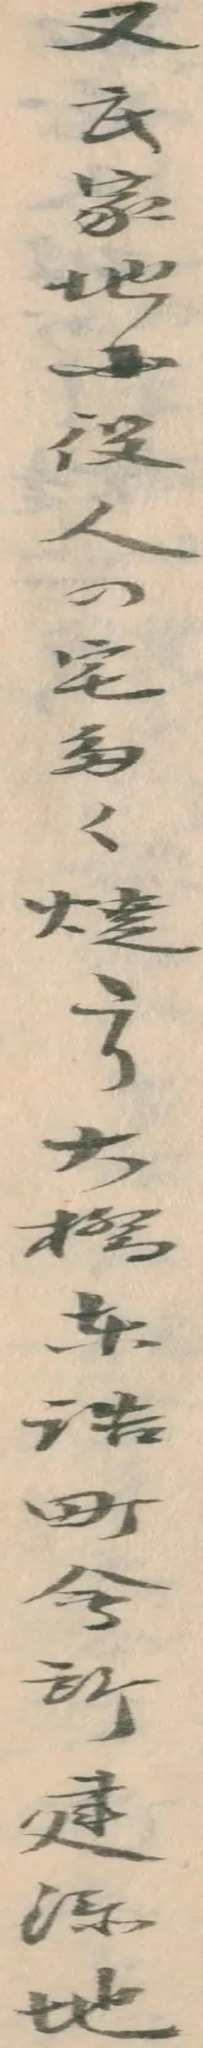又武家地小役人の宅多く焼たり大橋東詰町会所建添地

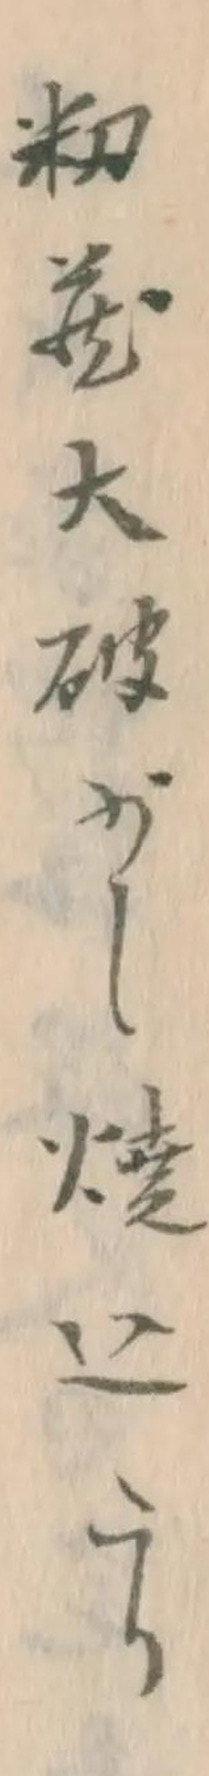籾蔵大破少し焼込たり
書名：地災撮要. 巻7-9(地震之部)
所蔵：国立国会図書館 National Diet Library, JAPAN
